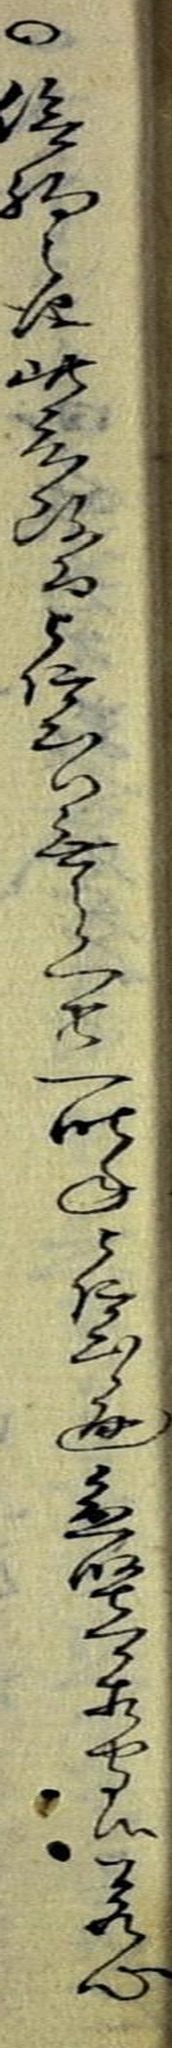〇倹約之儀此度改而被仰出は無之候へ共一昨年被仰出候通愈堅可相守候若心
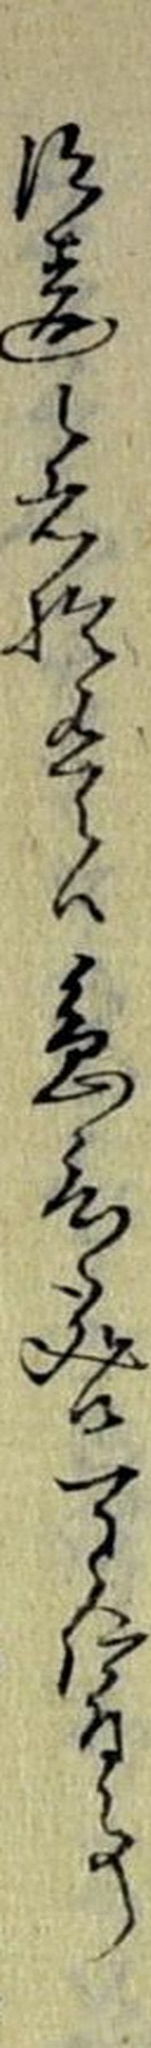得違之者於有之は急度御咎可被仰付事
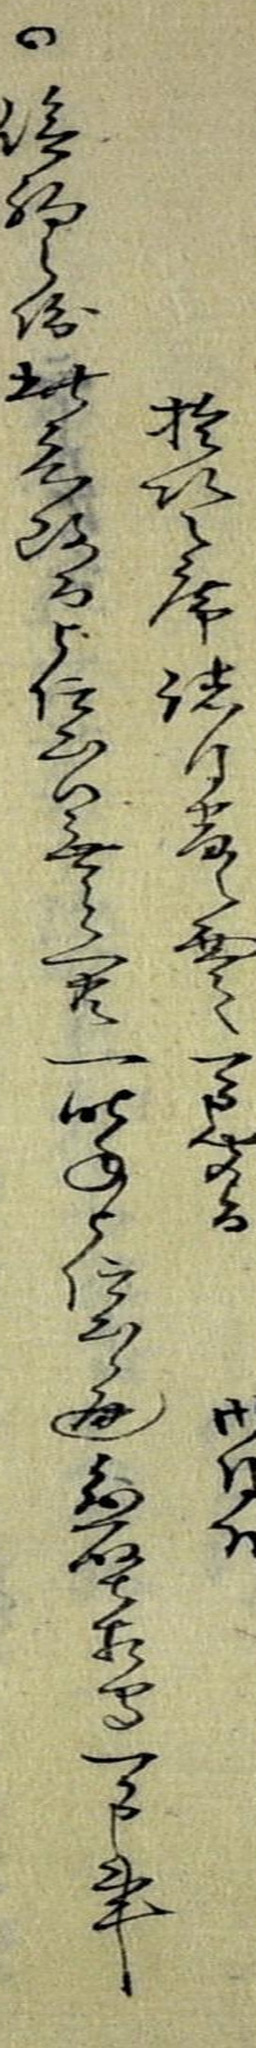〇倹約之儀此度改而被仰出は無之候へ共一昨年被仰出候愈堅相守可申事
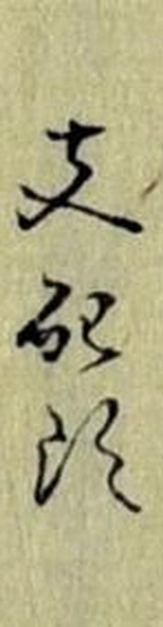支配頭
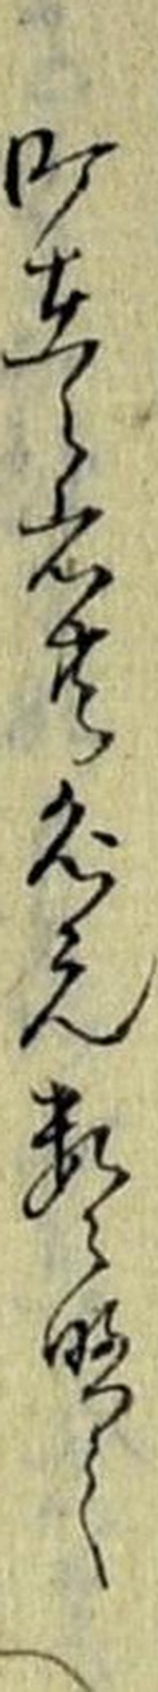町在之者共名元数々略之
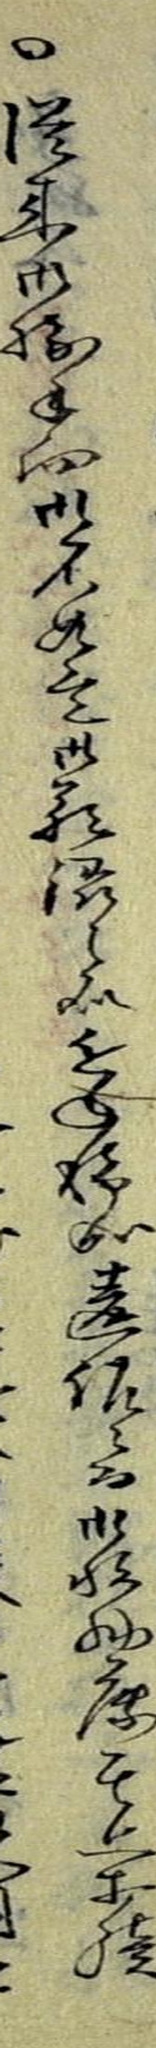〇従来御勝手向御不如意御難渋之処近年稀成違作に而御収納薄其上打続
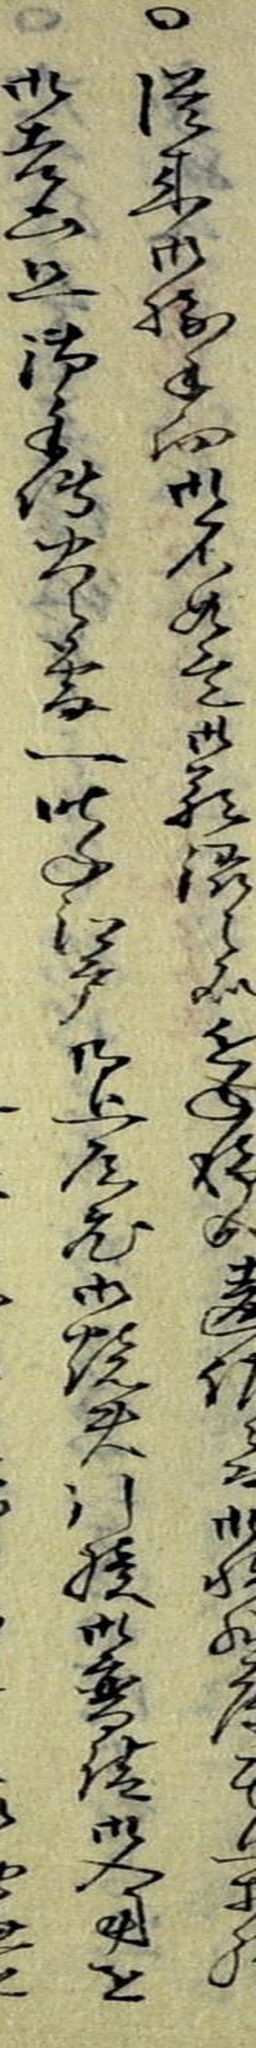御吉凶且御手伝火之御番一昨年江戸御上屋敷御焼失引続御普請御入用を
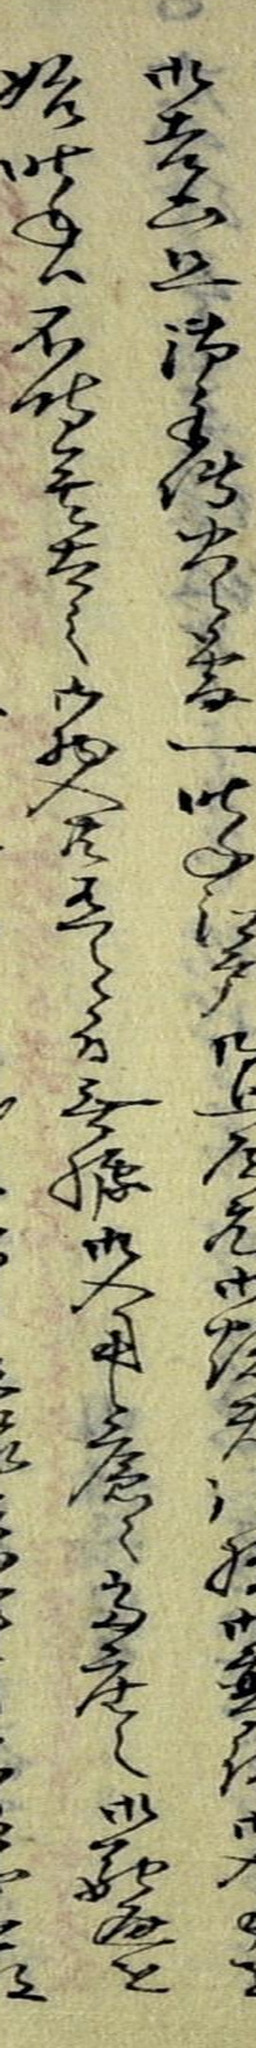始昨年は不時莫大之御物入共有之候に付無拠御入用廉々当座之御勤通を
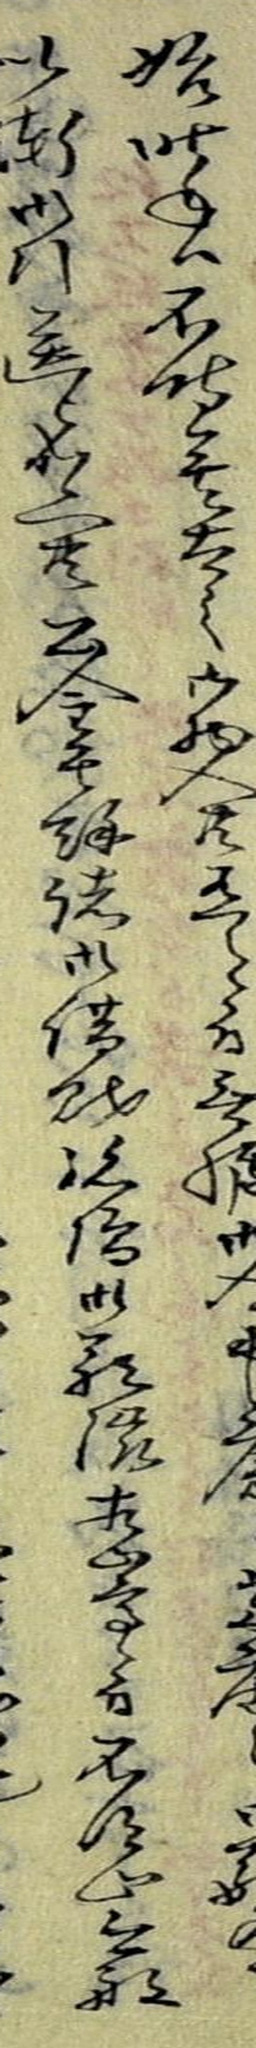以漸御引送被成候へ共公金其余諸御借財弥増御難渋相嵩候に付不得止今般
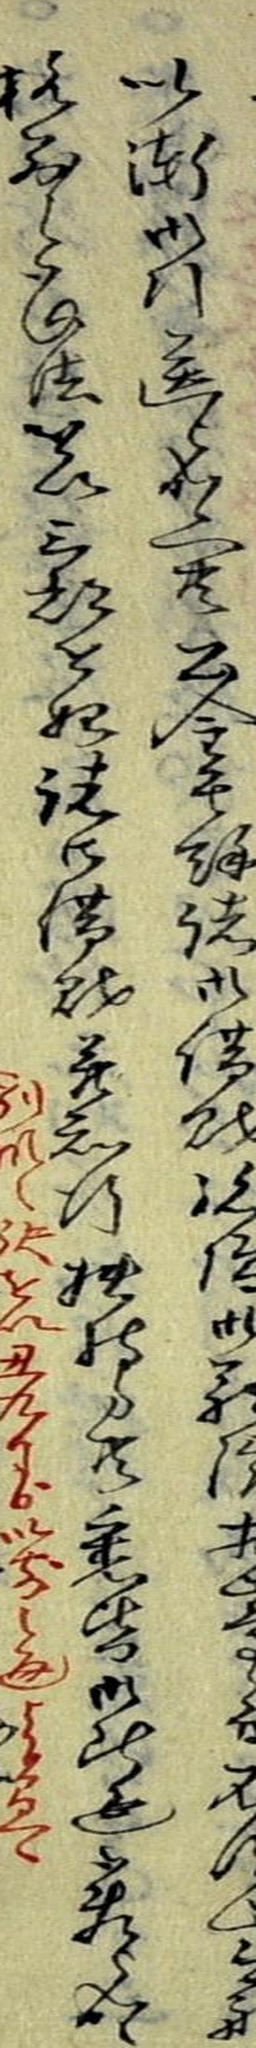格別之御趣法を以三都を始諸口借財并知行扶持方共悉皆御断延御頼被成候
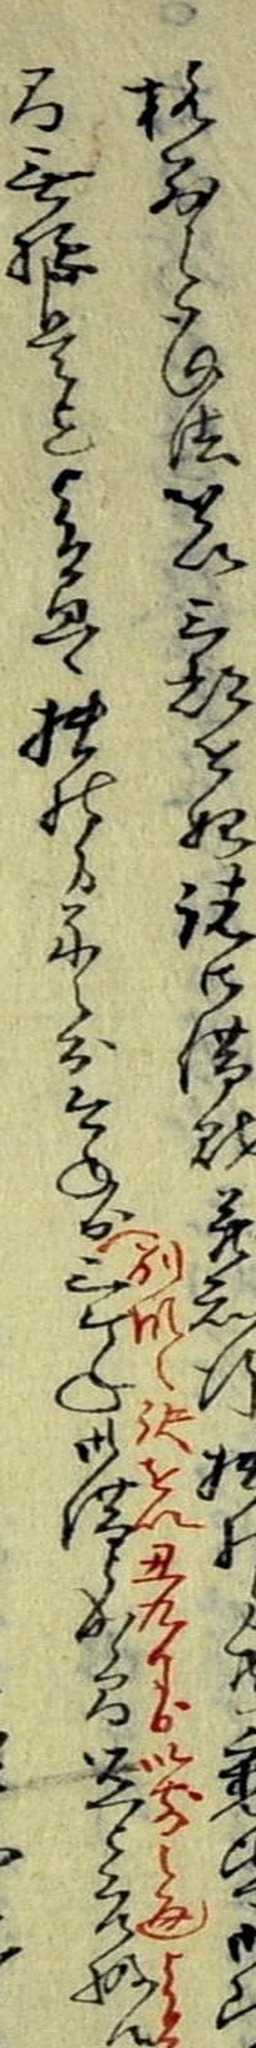間無拠是迄被下置候扶持方米之分今年ゟ三ヶ年御借被成候間宜被取扱候
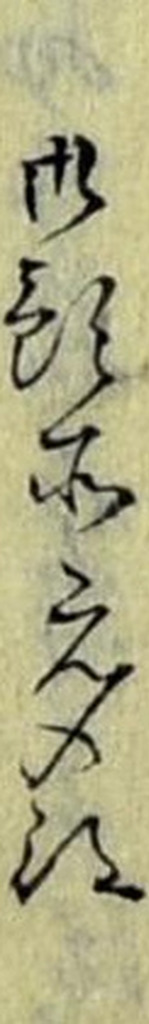御預所元〆役
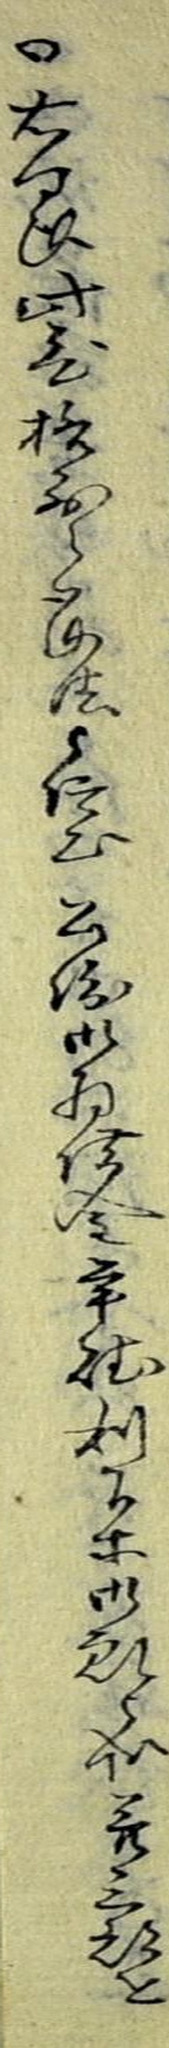〇右御趣此度格別之御趣法被仰出公儀御拝借金年賦利下等御願被成并三都を

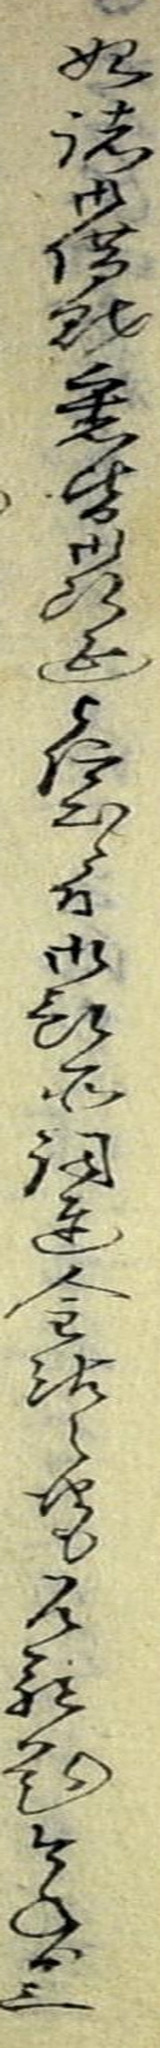始諸御借財悉皆御断延被仰出候に付御預所調達金銀之儀も乍難題今年ゟ三
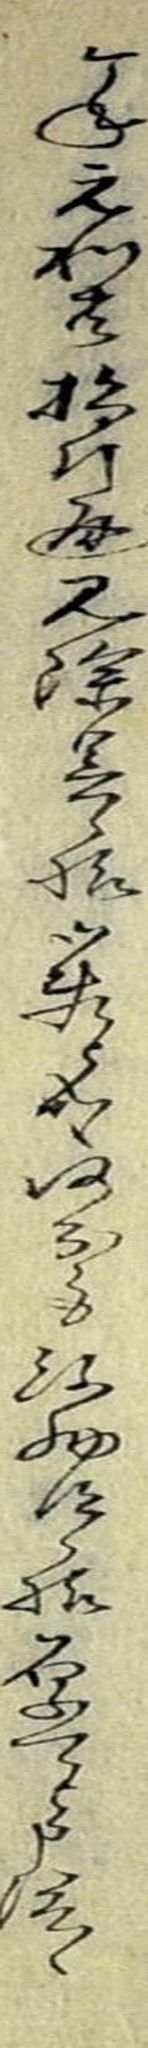ヶ年元利共指引通見除呉候様御頼被成候何分にも致納得候様厚可被申渡候
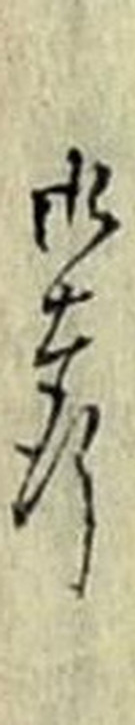御奉行
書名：命令之部 六
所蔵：福井県文書館 Fukui Prefectural Archives
